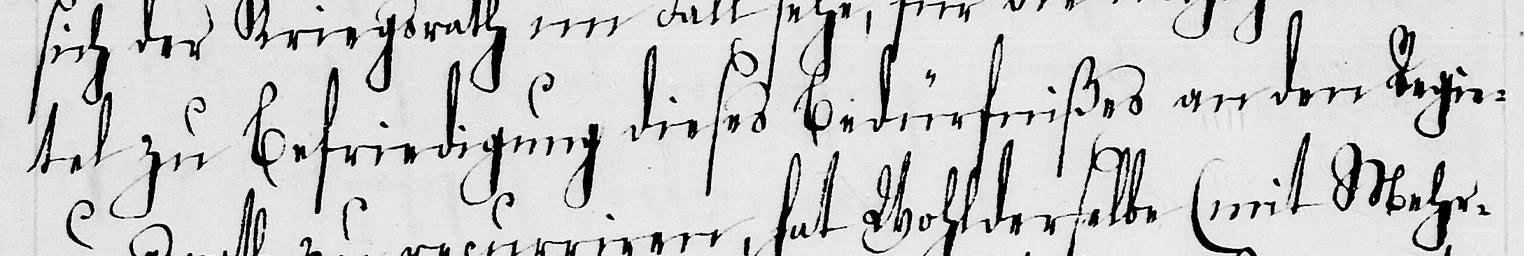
tel zu Befriedigung dieses Bedürfnißes an den Regie¬
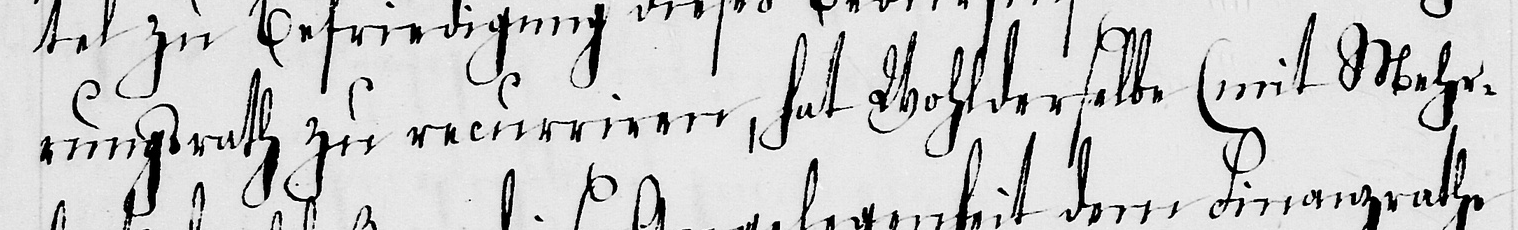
rungsrath zu recurriren, hat Wohlderselbe (mit Mehr¬
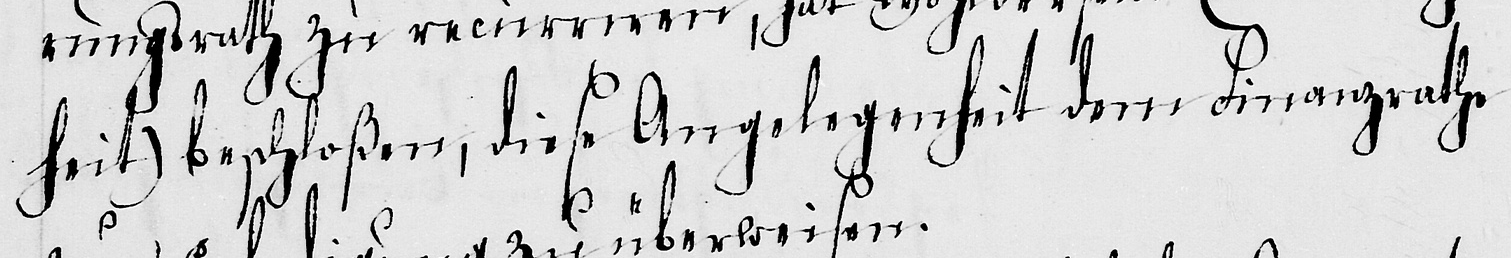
heit) beschloßen, diese Angelegenheit dem Finanzrathe
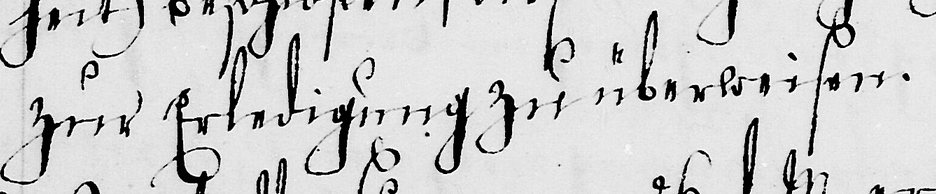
zur Erledigung zu überweisen.
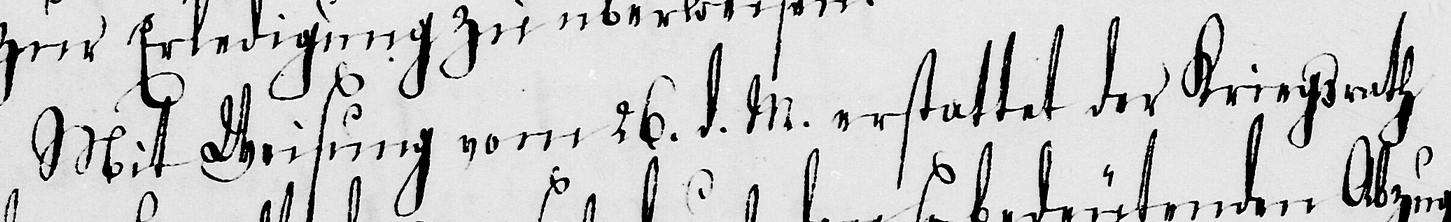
Mit Weisung vom 26. d. M. erstattet der Kriegsrath
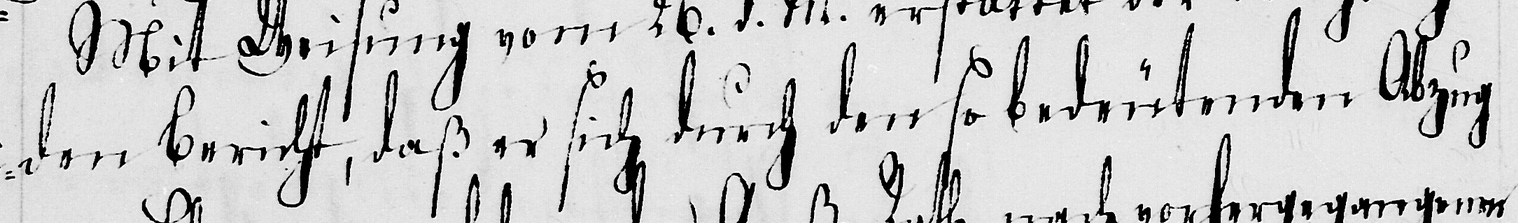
den Bericht, daß er sich durch den so bedeutenden Abzug
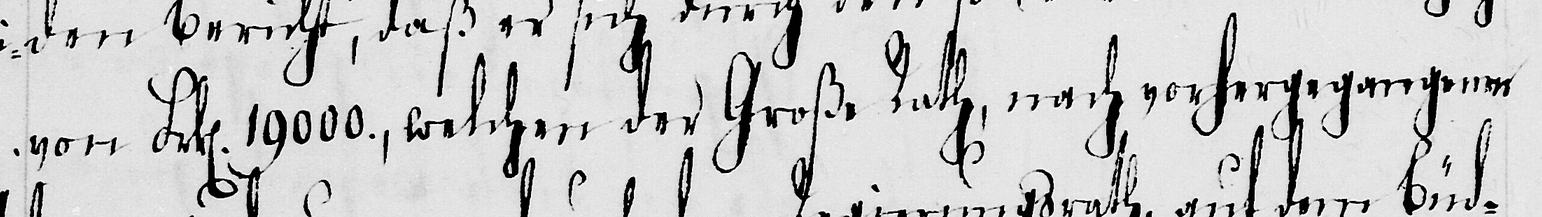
von Frk[en]. 19000., welchen der Große Rath, nach vorhergegangenen
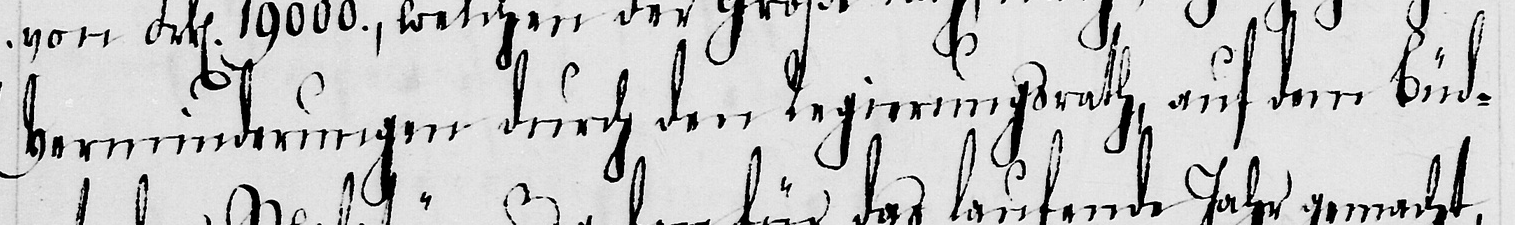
Verminderungen durch den Regierungsrath, auf dem Büd¬
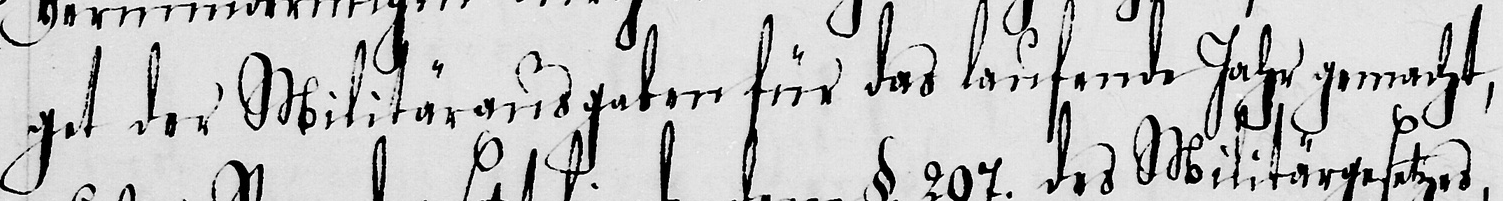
get der Militärausgaben für das laufende Jahr gemacht,
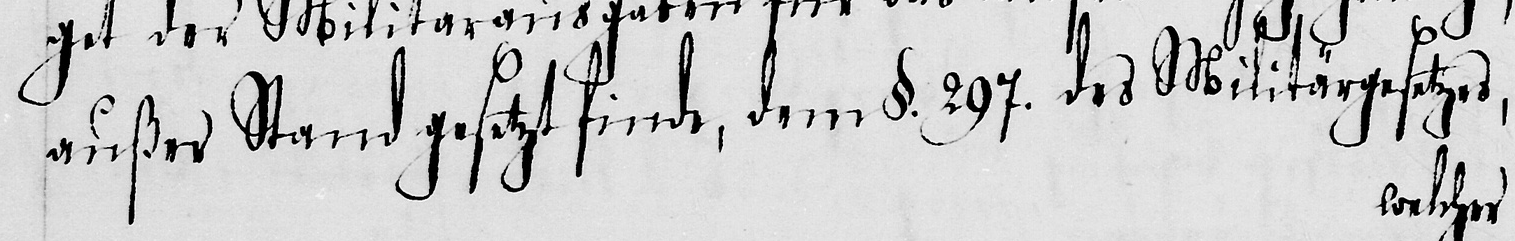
außer Stand gesetzt finde, dem §. 297. des Militärgesetze¬
